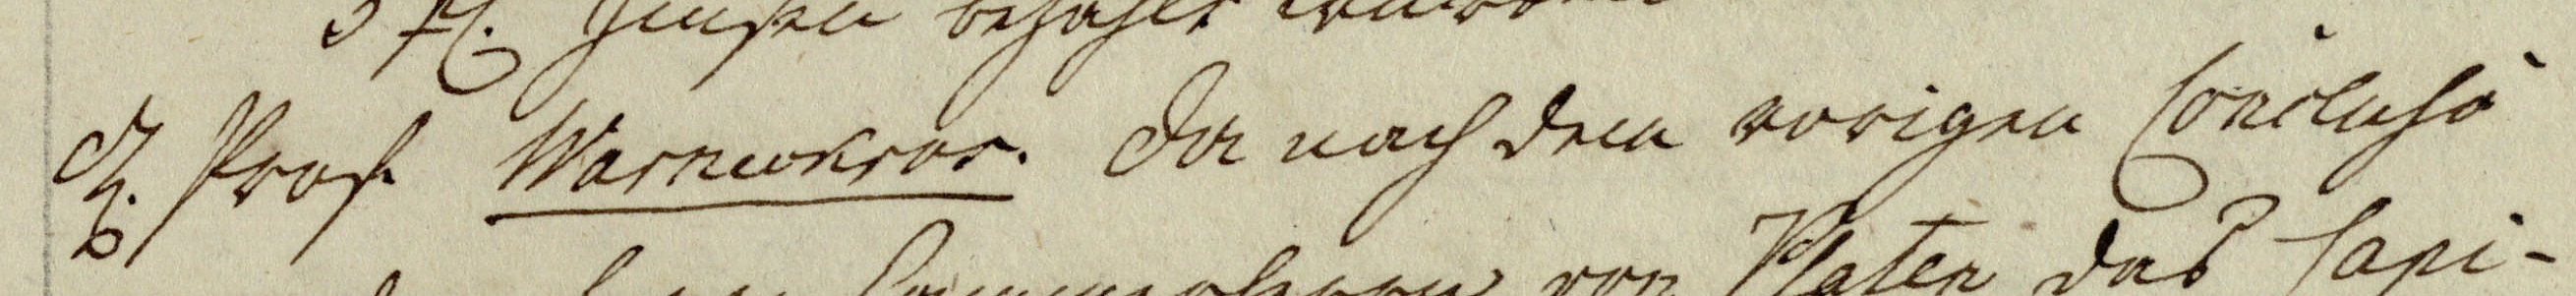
dh. Prof. Warneckros. Da nach dem vorigen Concluso
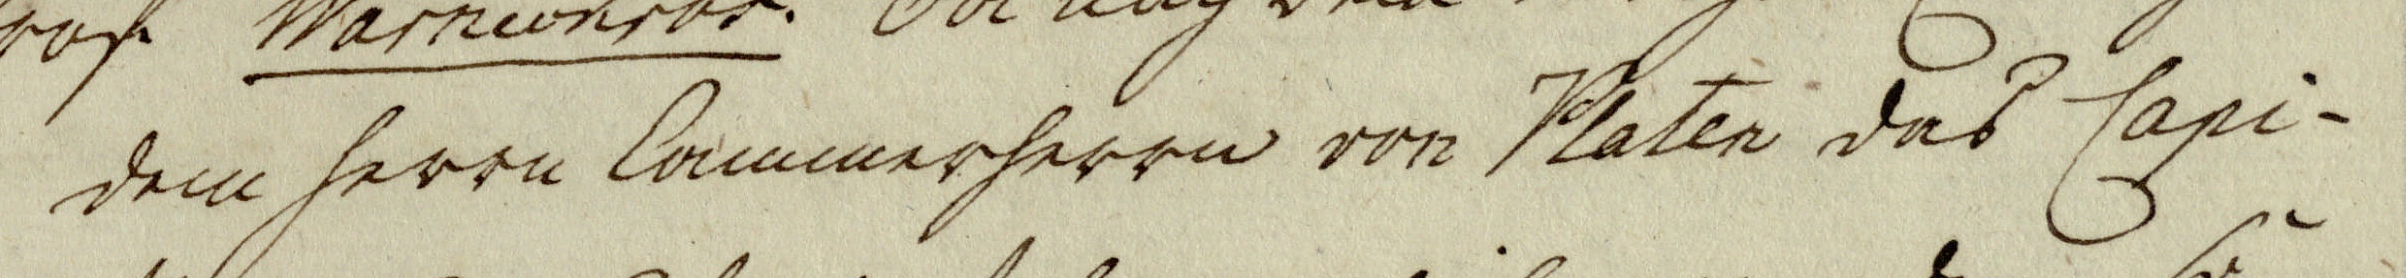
dem Herrn Cammerherrn von Platen das Capi¬
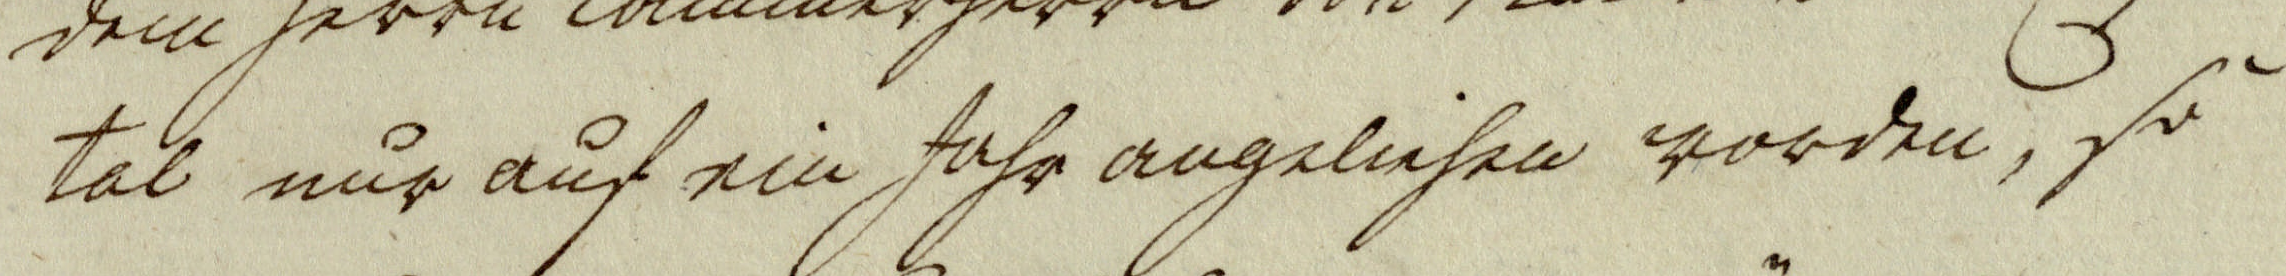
tal nur auf ein Jahr angeliehen worden, so
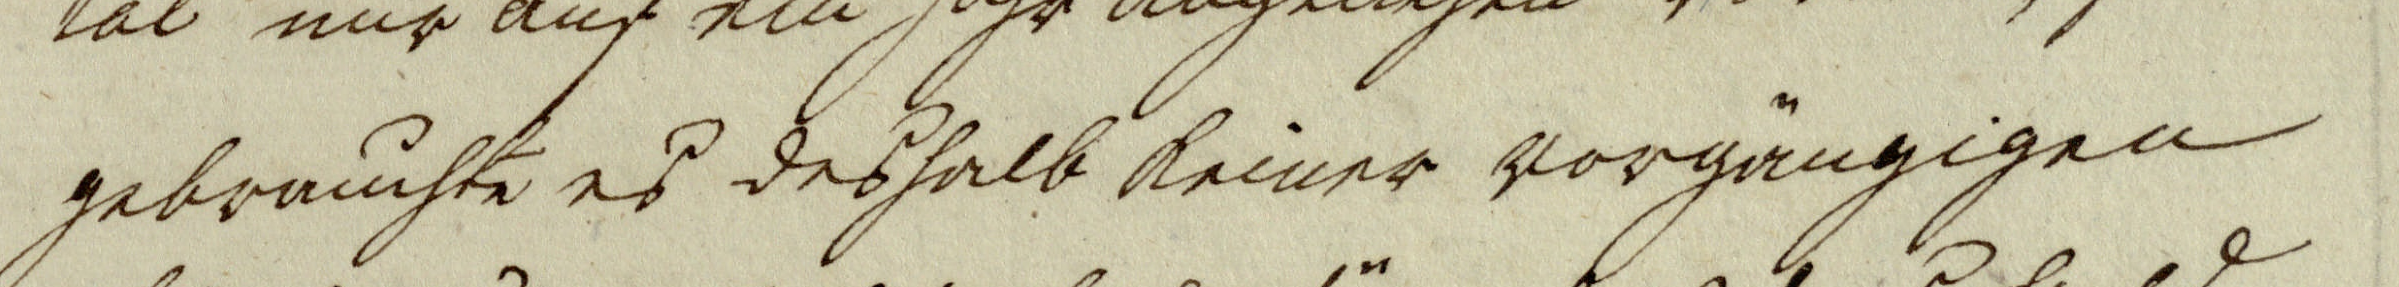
gebrauchte es deshalb keiner vorgängigen
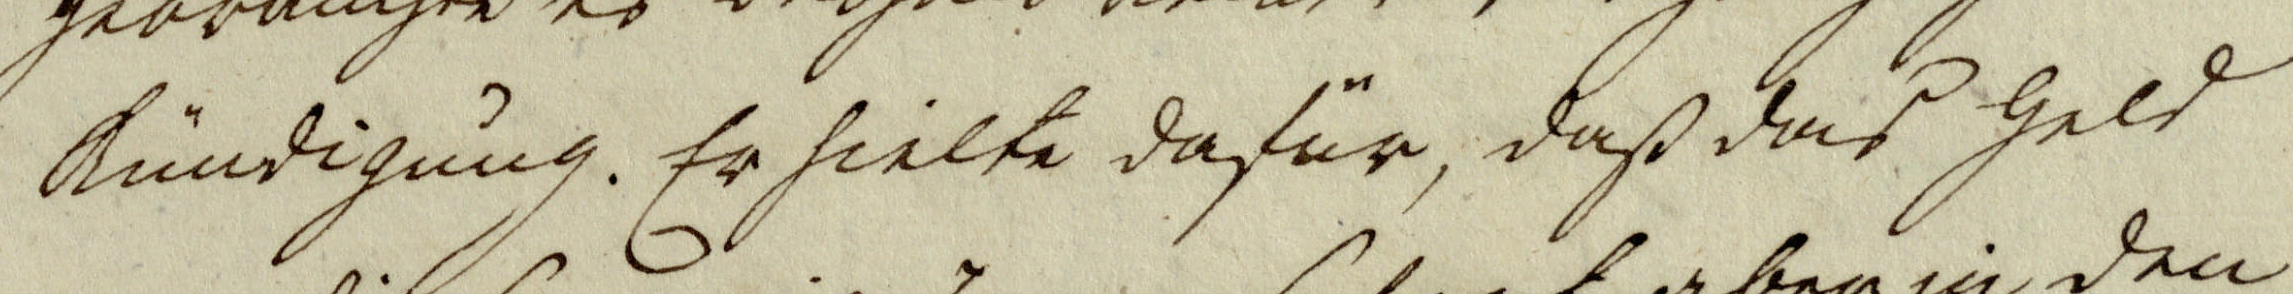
Kündigung. Er hielte dafür, daß das Geld
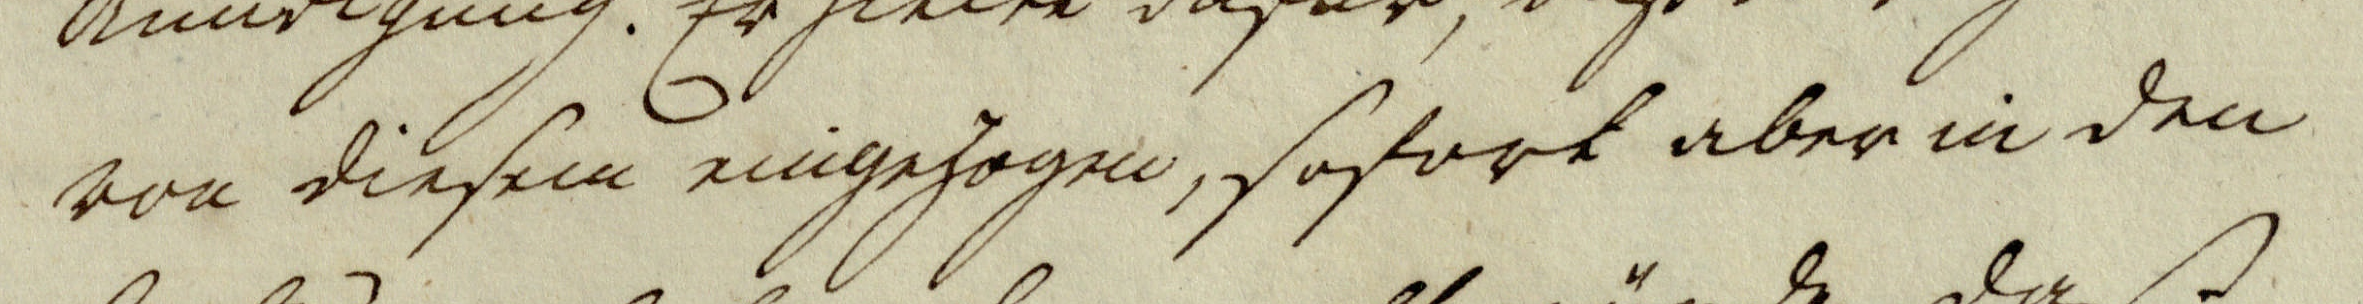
von diesem eingezogen, sofort aber in den
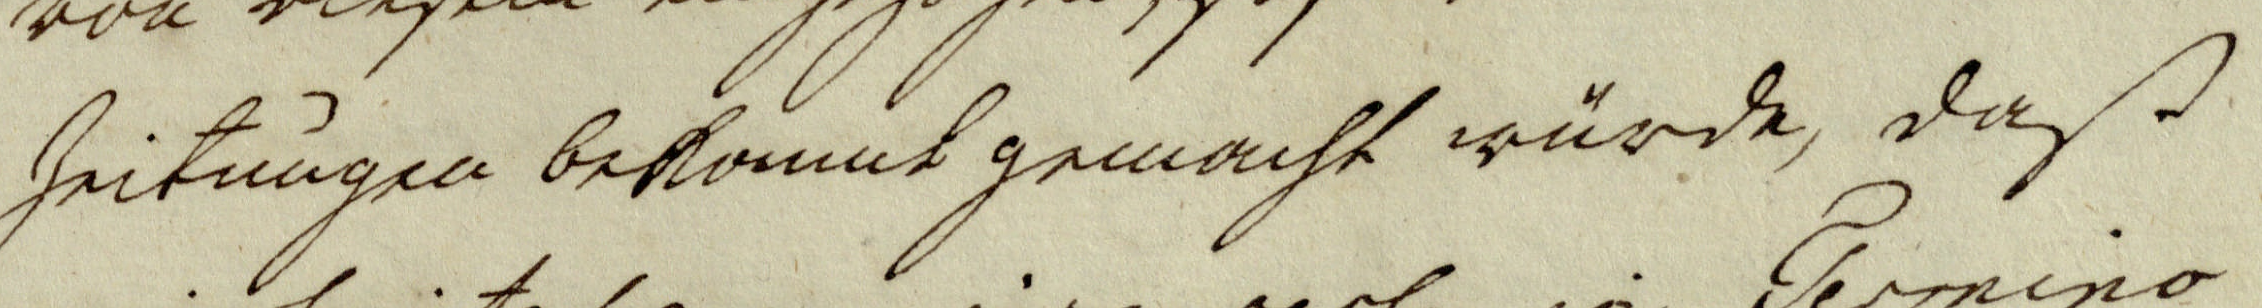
Zeitungen bekannt gemacht würde, daß
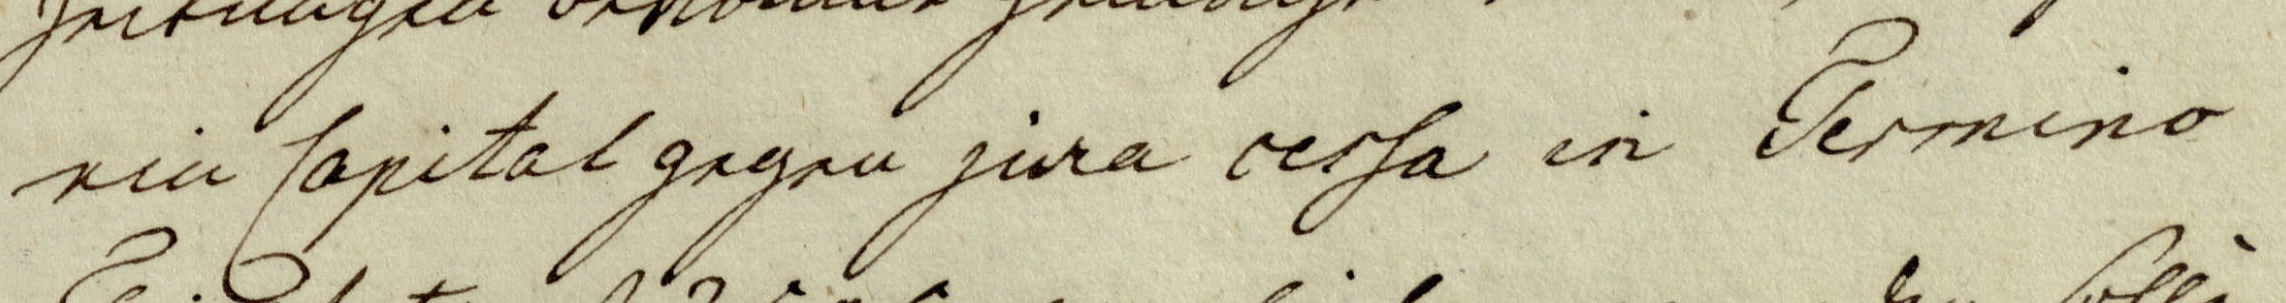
ein Capital gegen jura cessa in Termino
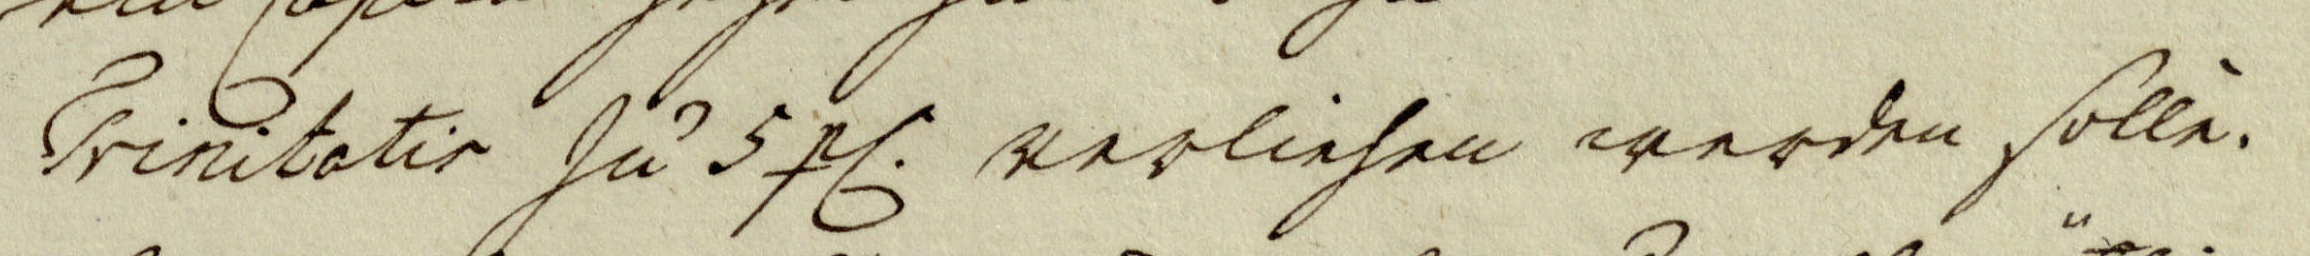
Trinitatis zu 5 pl. verliehen werden solle.
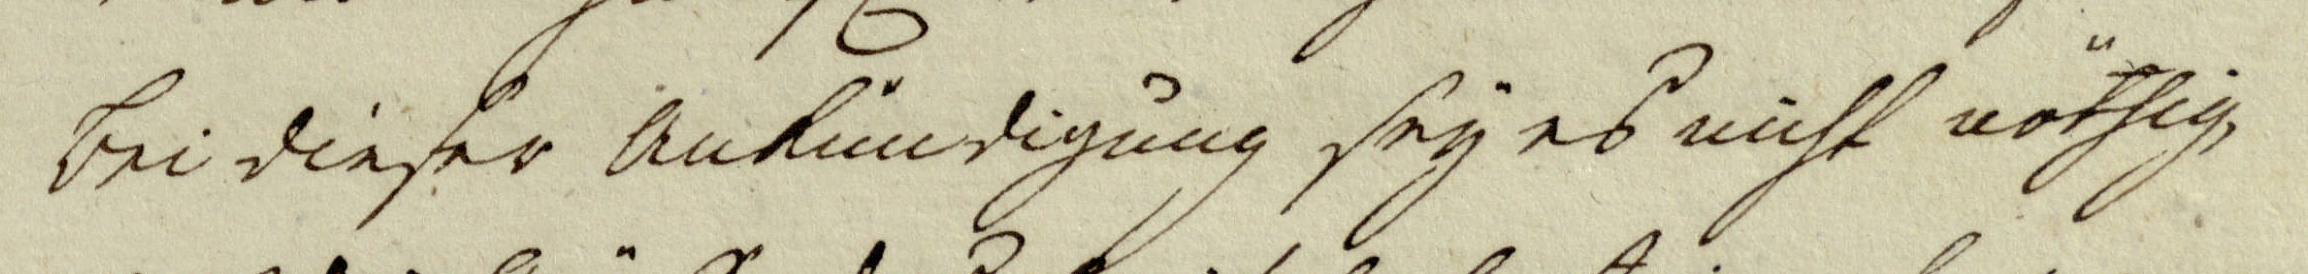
Bei dieser Ankündigung seÿ es nicht nöthig,
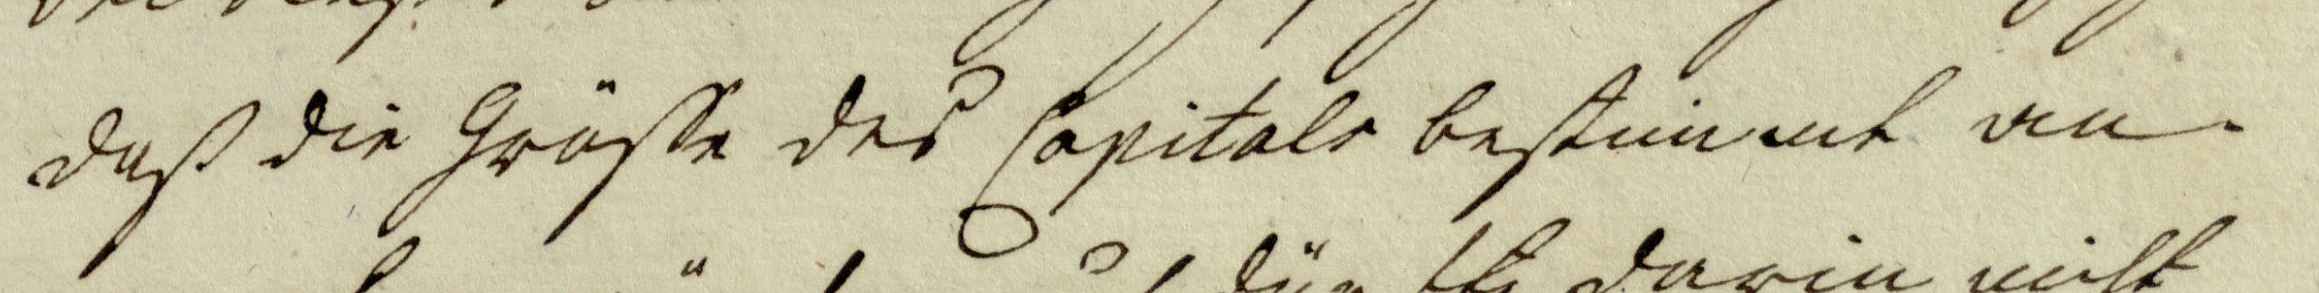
daß die Grösse des Capitals bestimmt an¬
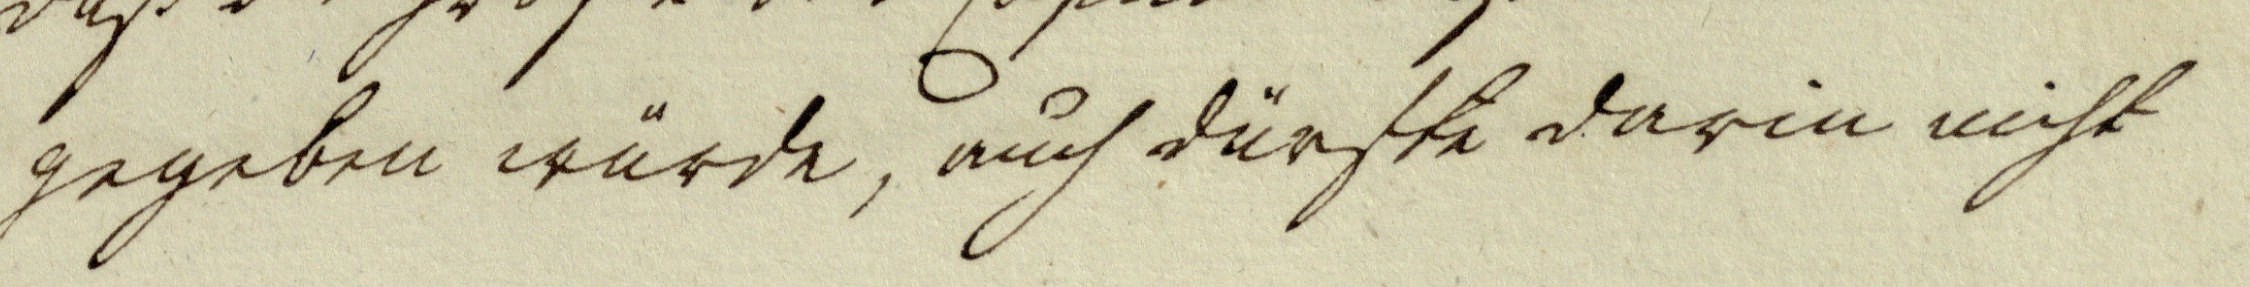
gegeben würde, auch dürfte darin nicht
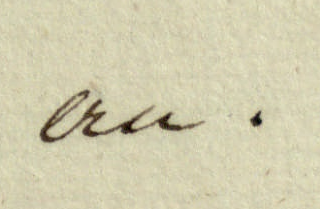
an¬
